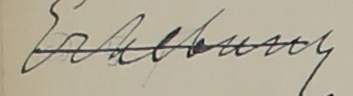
Erhebung
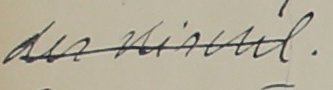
der kirchl
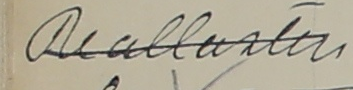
Reallasten
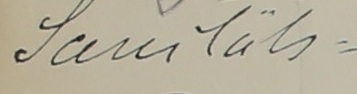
Sanitäts
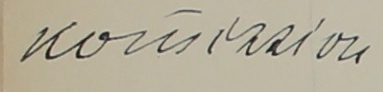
kommission
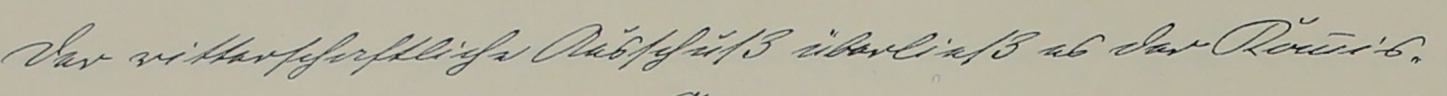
Der ritterschaftliche Ausschuß überließ es der Kommis-
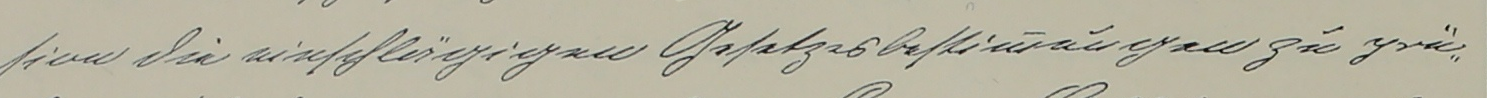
sion die einschlägigen Gesetzesbestimmungen zu prü-
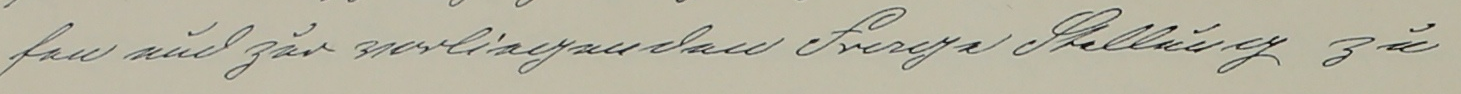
fen und zur vorliegenden Frage Stellung zu
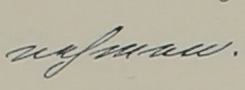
nehmen.
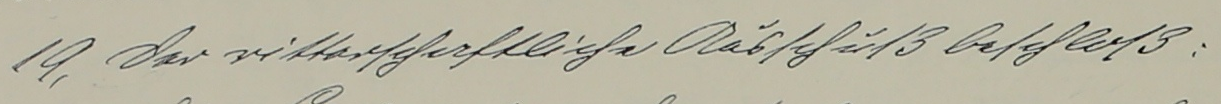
19. Der ritterschaftliche Ausschuß beschloß:
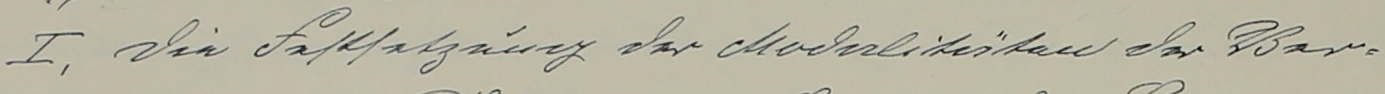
I. Die Festsetzung der Modalitäten der Ver-
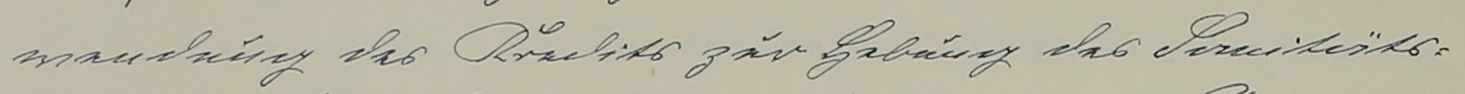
wendung des Kredits zur Hebung des Sanitäts-
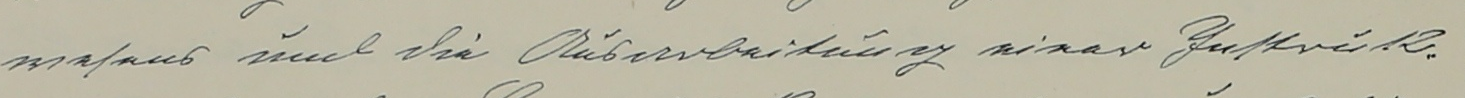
wesens und die Ausarbeitung einer Instruk-
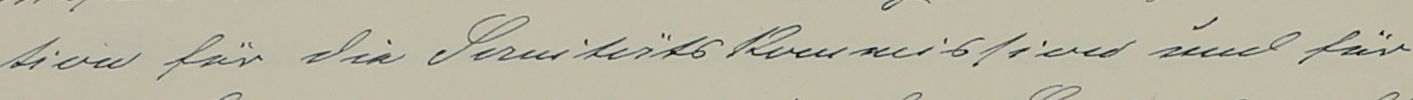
tion für die Sanitätskommission und für
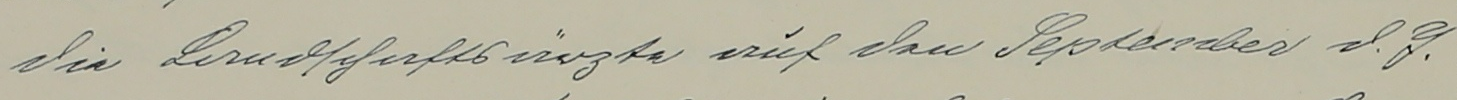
die Landschaftsärzte auf den September d.J.
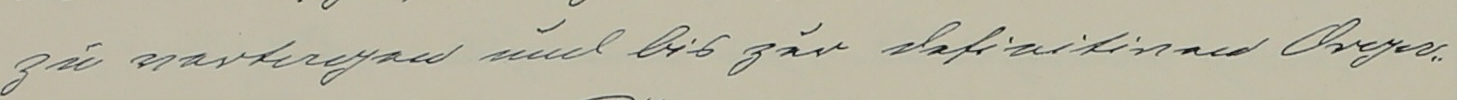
zu vertagen und bis zur definitiven Orga-
